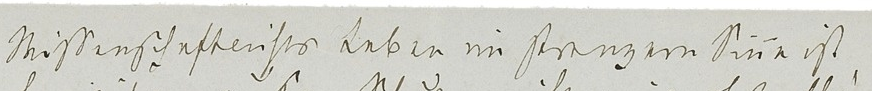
Wissenschaftliches Leben im strengern Sinne ist
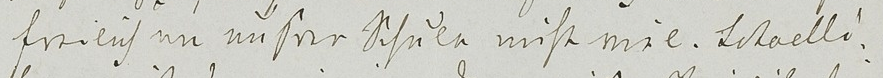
freilich an unsrer Schule nicht viel. Schaelli-
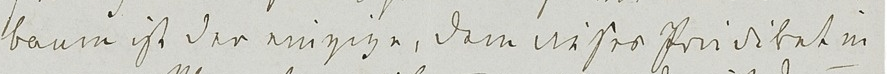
baum ist der einzige, dem dieses Prädikat in
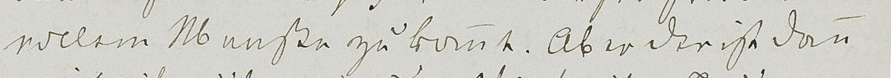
vollem Maaße zukommt. Aber der ist dann
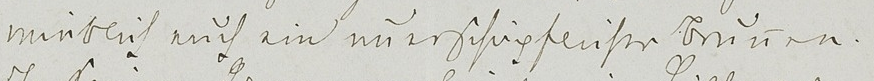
wirklich auch ein unerschöpflicher Brunnen.
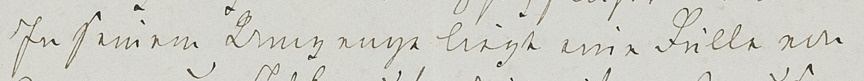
In seinem Umgange liegt eine Fülle von
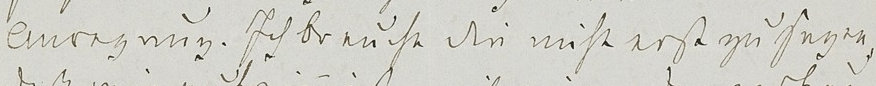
Anregung. Ich brauche dir nicht erst zu sagen,
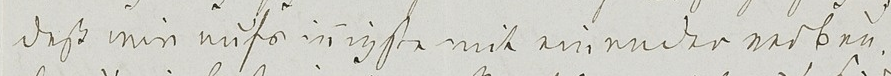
daß wir aufs innigste mit einander verbun-
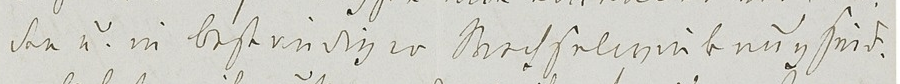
den u. in beständiger Wechselwirkung sind.
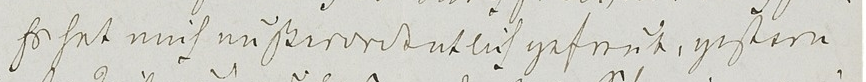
Es hat mich außerordentlich gefreut, gestern
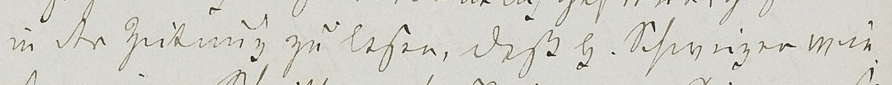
in der Zeitung zu lesen, daß H. Schweizer wie-
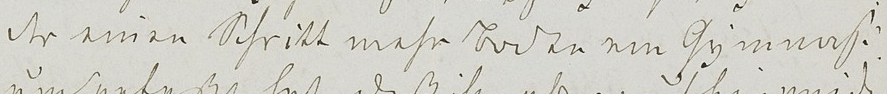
der einen Schritt mehr Boden am Gymnasi-
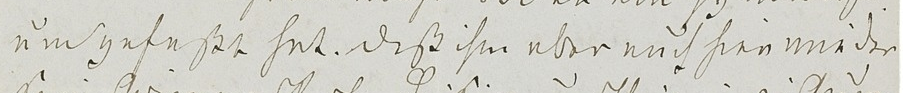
um gefaßt hat. Daß ihm aber auch hier wieder
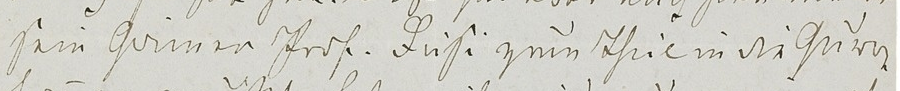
sein Gönner Prof. Fäsi zum Theil in die Quere
